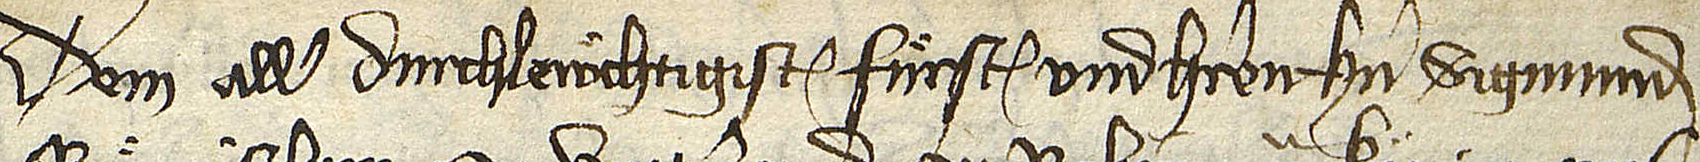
Dem all* durchlewchtigiſt* fürſt* vnd h*ren H*n Sigmund*
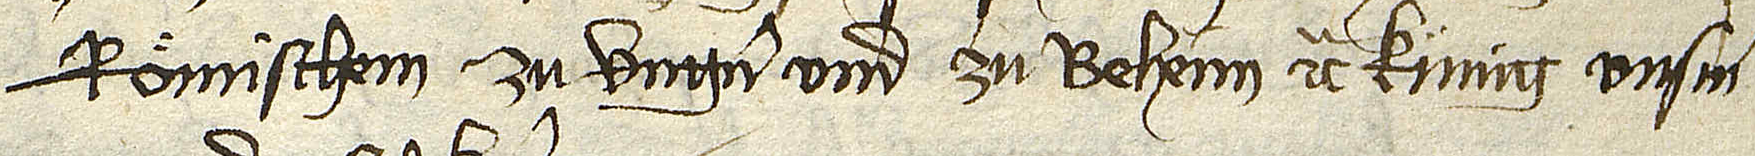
Römiſchem ʒu Vng*n vnd ʒu Beheim ec* künig vnſ*m
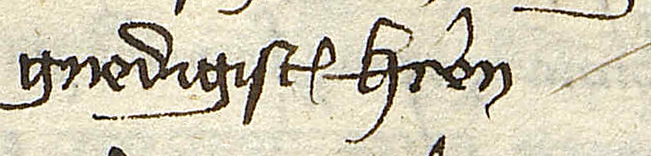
gnedigiſt* H*ren /
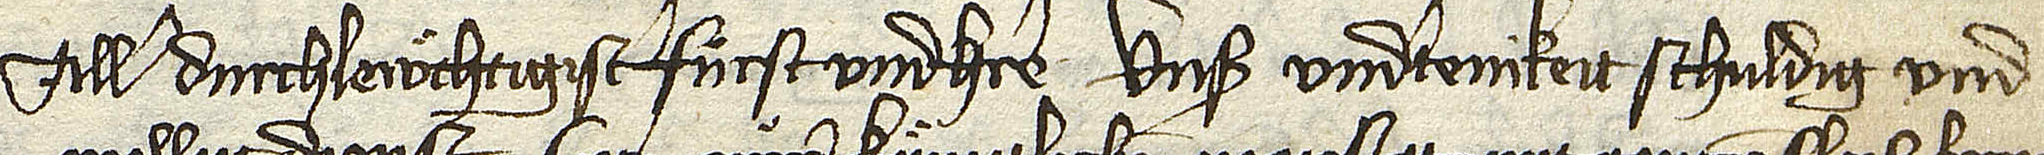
All* durchlewchtigiſt* fürſt vnd h*re . Vnſ* vnd*tenikeit ſchuldig vnd
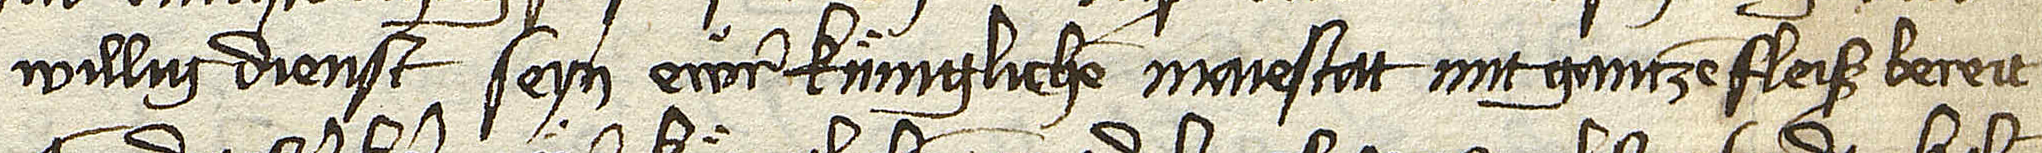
willig dienſt ſeyn ew*r künigliche* maieſtat mit gancʒe* fleiſʒ bereit
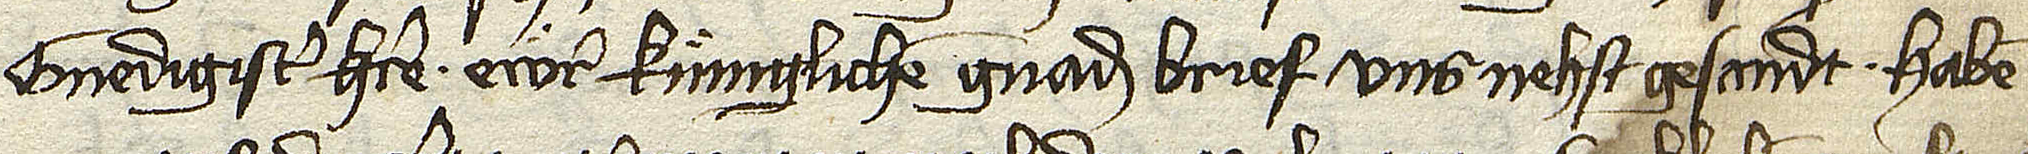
Gnedigiſt* h*re . ew*r künigliche* gnad* brief vns nehſt geſandt . habe*
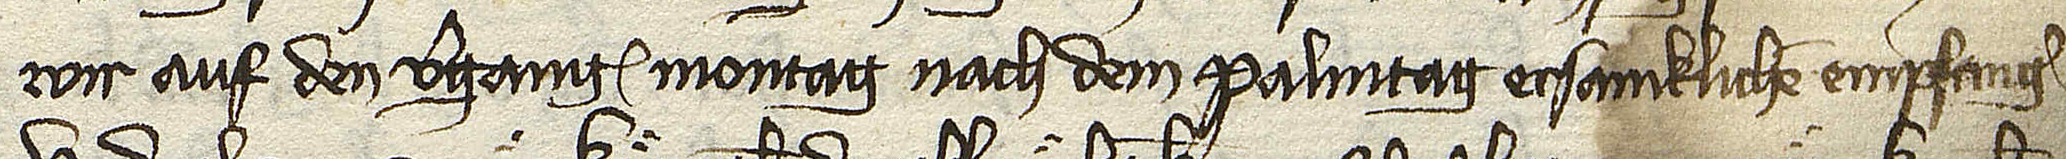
wir auf den v*gang* montag nach dem Palmtag erſamkliche* . empfang*
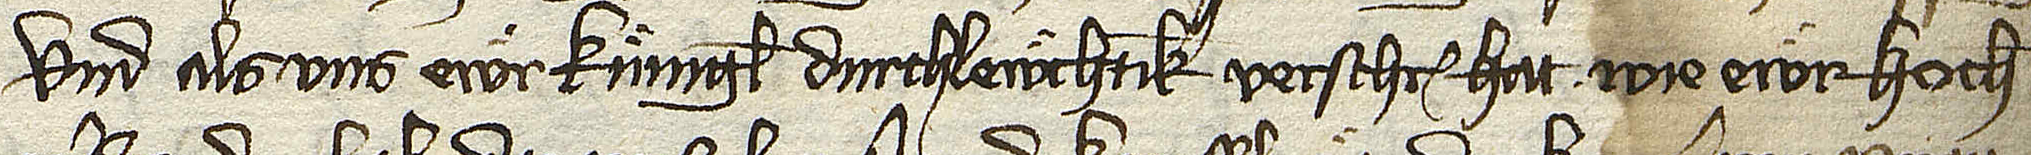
Vnd als vns ewr künigl* durchlewchtik* verſchr* hat. wie ewr hoch*
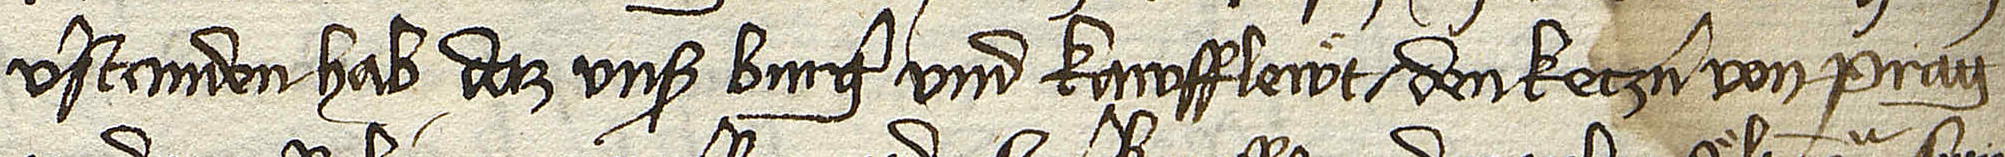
v*ſtanden hab daʒ vnſ* burg* vnd kawfflewt / den kecʒ*n von Prag
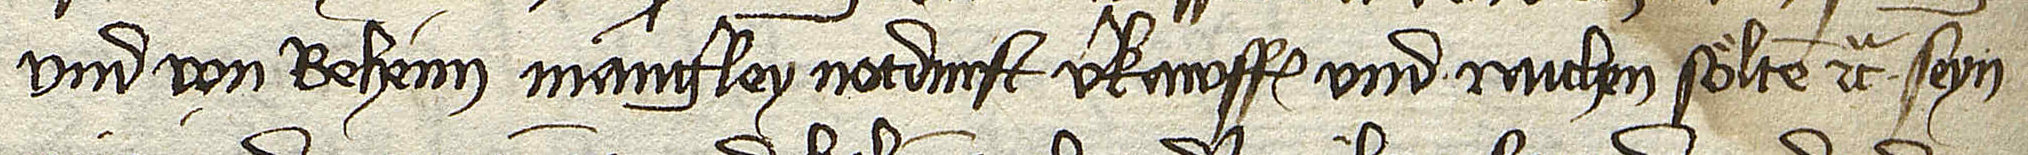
vnd von Beheim mang*ley notdurft v*kawff* vnd raichen ſölte* ec* . ſeyn
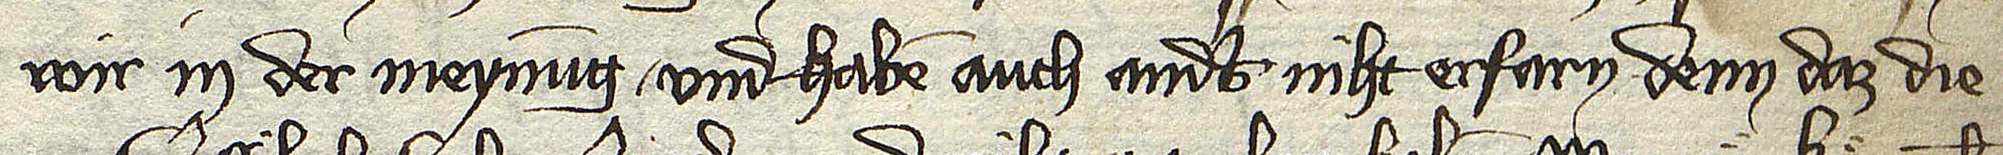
wir in der meynu*g / vnd habe* auch and*s niht erfarn . denn daʒ die
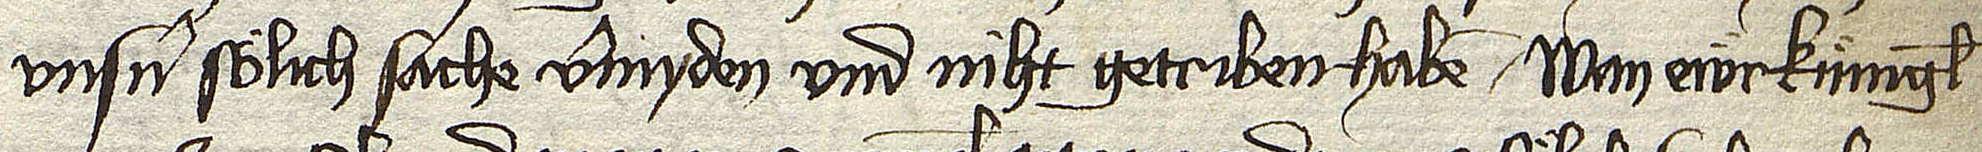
vnſ*n ſölich ſache v*myden vnd niht getriben habe* / Wan ewr künigl*
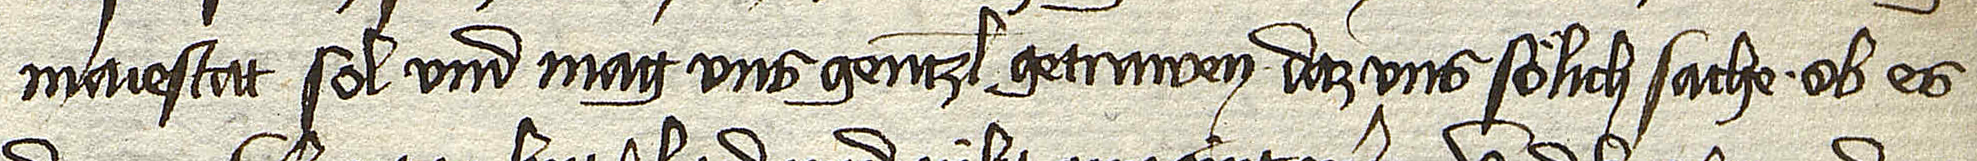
maieſtat ſol vnd mag vns gencʒl* getrawen . daʒ vns ſölich ſache . Ob es
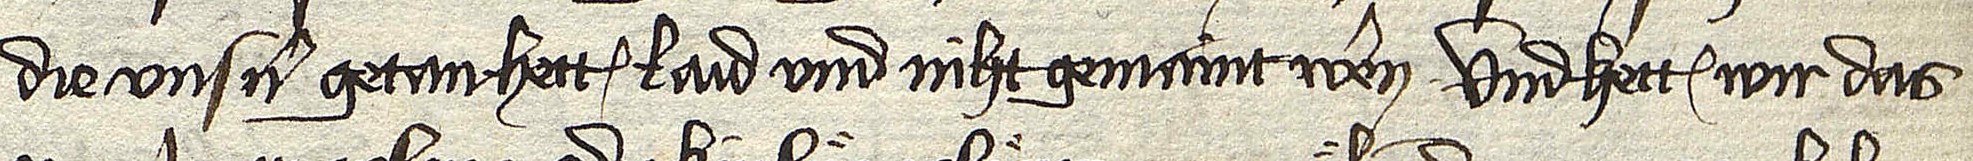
die vnſ*n getan hett* laid vnd niht gemaint we*n . Vnd hett* wir das
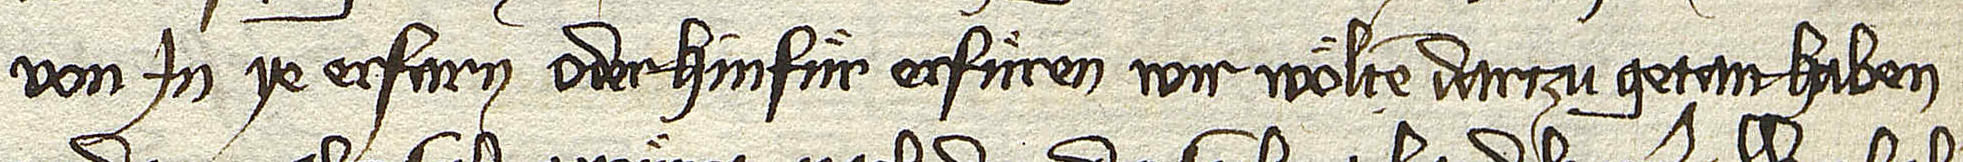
von In ye erfarn oder hinfür erfüren wir wölte* darcʒu getan haben
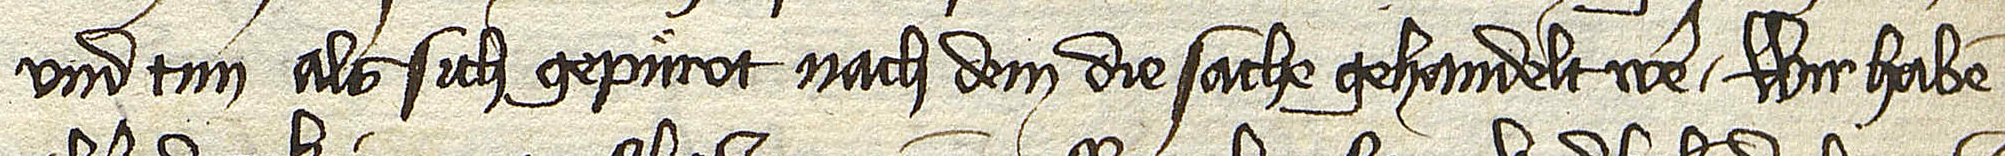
vnd tun als ſich gepürot nach dem die ſache gehandelt we* / Wir habe*
